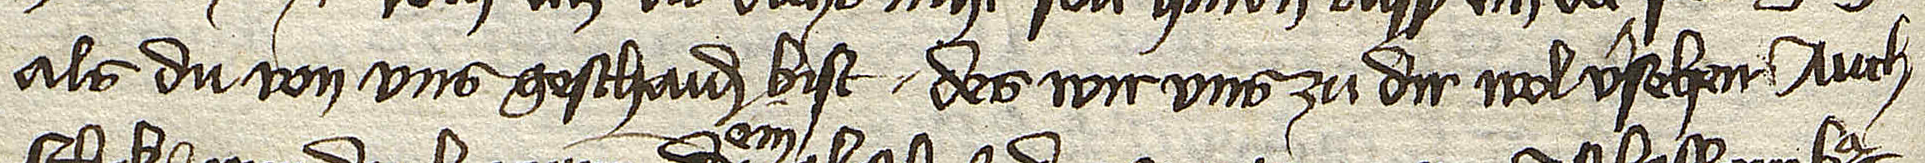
als du von vns geſchaid* biſt / des wir vns ʒu dir wol v*ſehen Auch
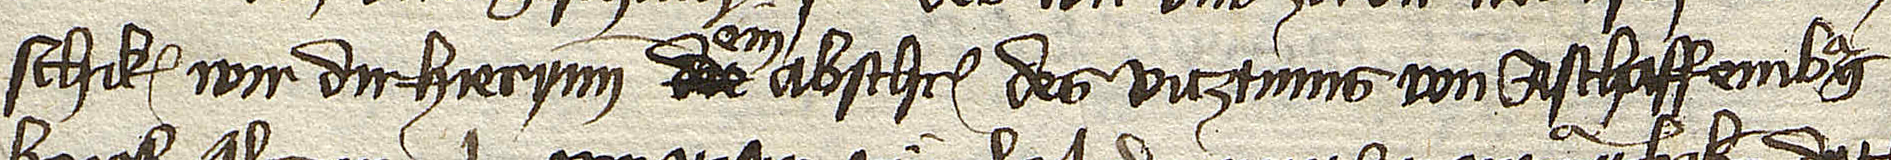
ſchik* wir dir hierynn* die abſchr* des vicʒtums von Aſchaffemb*g
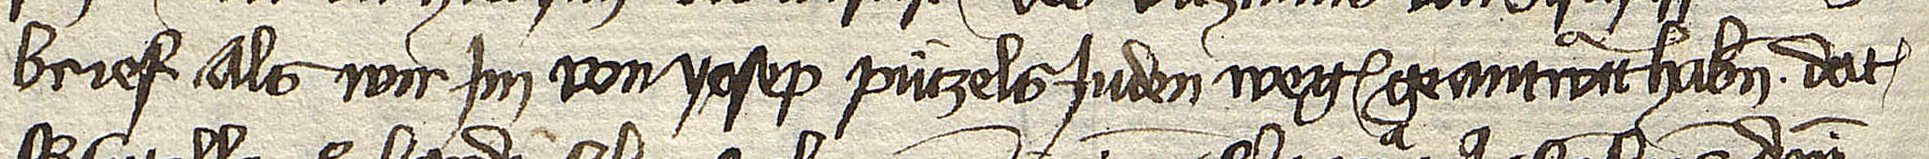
brief / Als wir Im von yoſep pücʒels Iuden weg* geantw*tt habn* . dat*
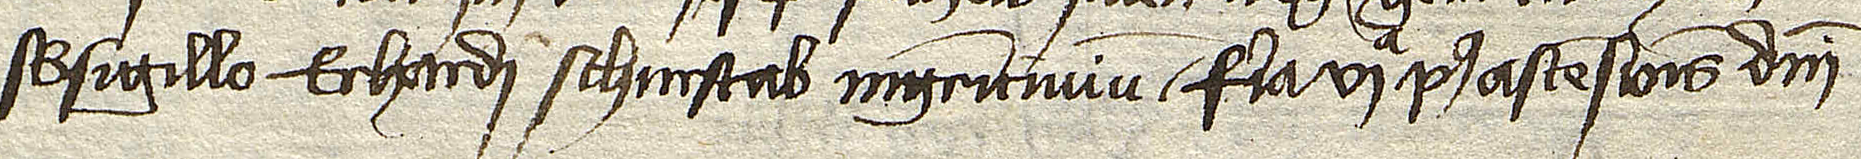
ſ*ſigillo Erhardi ſchurſtab mgri*ciuiu* / fi*a vi* p* aſce*ſioi*s dni*
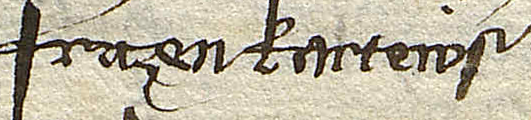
Fricʒen Karteẅſ*
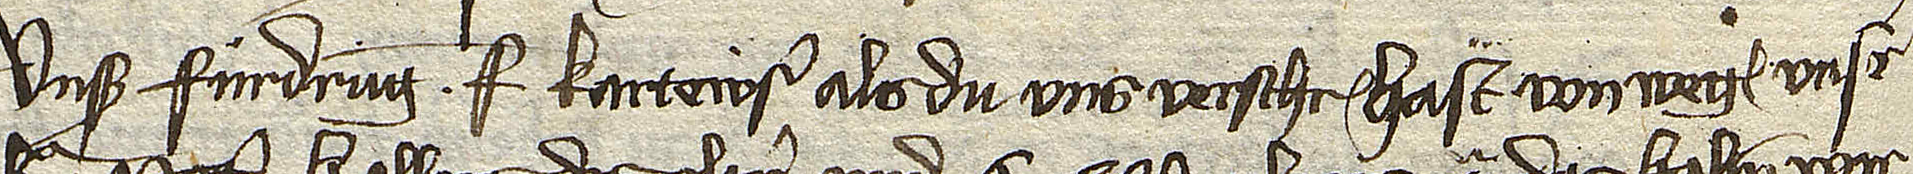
Vnſ* fürdru*g . f* karteẅſ* als du vns verſchr* haſt von weg* vnſr*
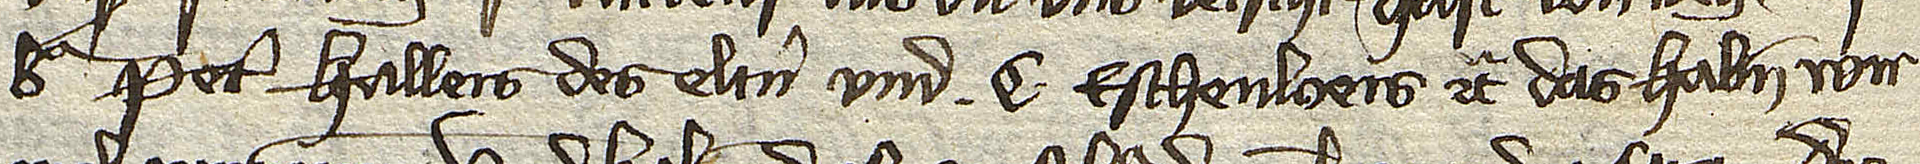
b* Pet* Hallers des eltn* vnd . C . Eſchenloers ec* das habn* wir
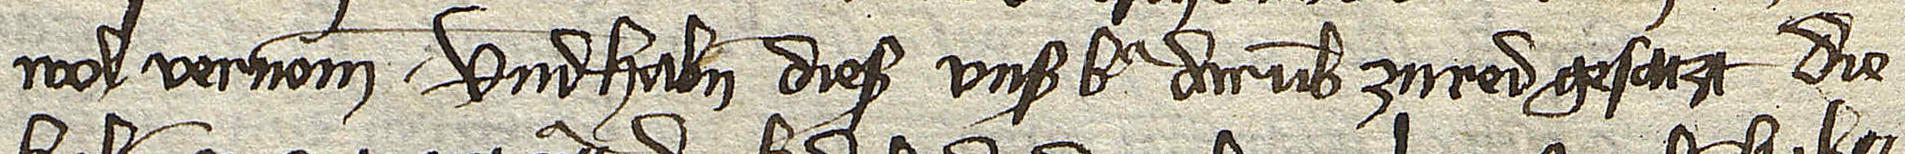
wol vernom* / Vnd habn* dieſ* vnſ* b* darub* ʒured geſacʒt Die
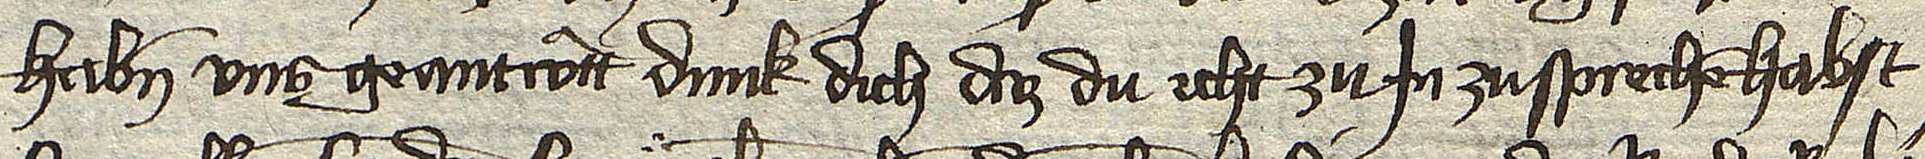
habn* vns geantw*tt dunk dich daʒ du icht ʒu In ʒuſpreche* habſt
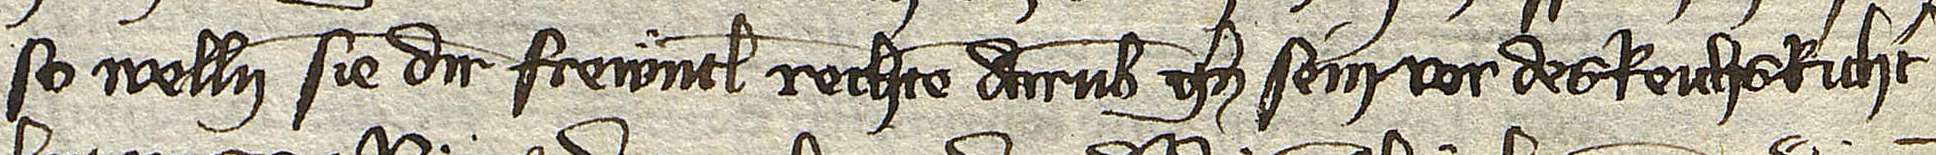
ſo welln* ſie dir freẅntl* rechte* darub* g*n ſein vor des Reichs Richt*
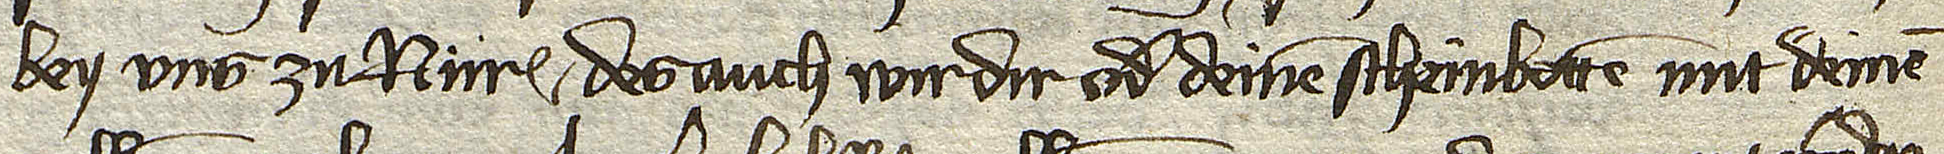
bey vns ʒu Nür* / Des auch wir dir od* deine* ſcheinbotte* mit deine*
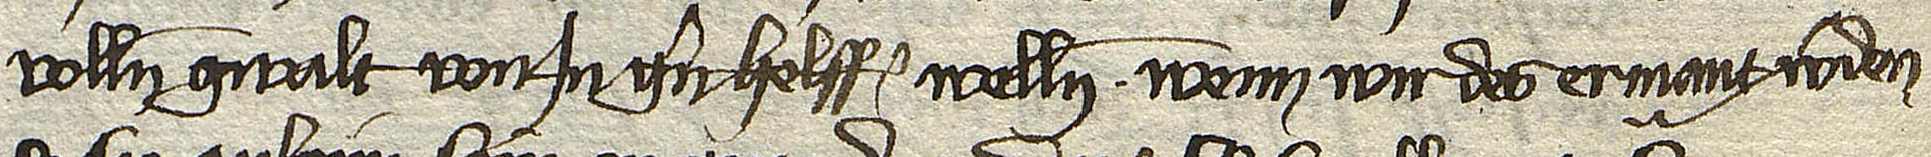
volln* gwalt von In g*n helff* welln* . wenn wir des ermant w*den
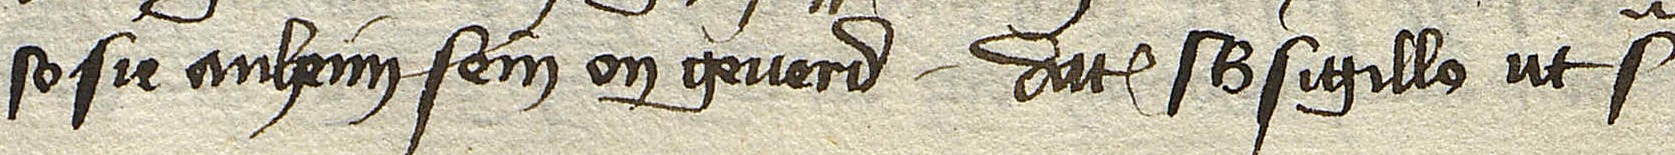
ſo ſie anheim ſein on geuerd / Dat* ſ* ſigillo ut ſ*
